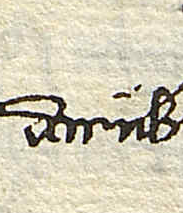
darüb*
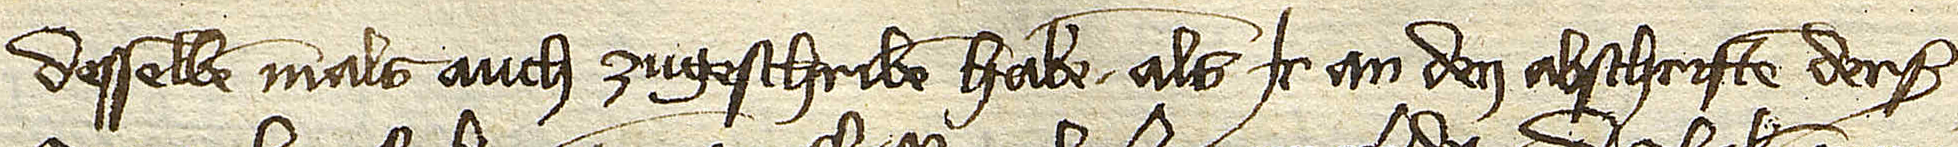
deſſelbe* mals auch ʒugeſchribe* habe* . als Ir an den abſchrifte* derſ*
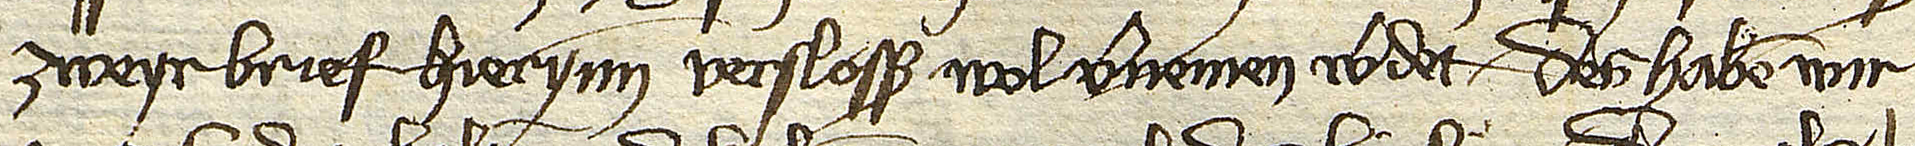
ʒweyr brief hierynn* verſloſſ* wol v*nemen w*det / Des habe* wir
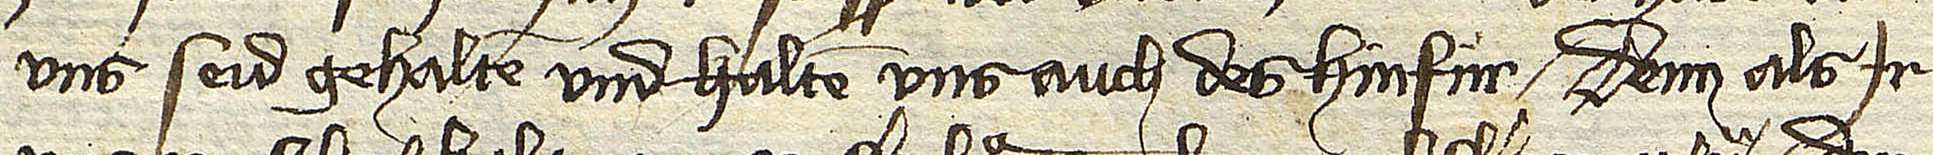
vns ſeid gehalte* vnd halte* vns auch des hinfür / Denn als Ir
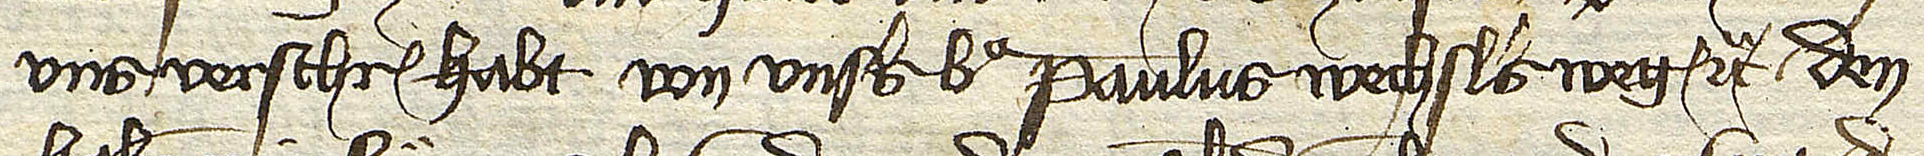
vns verſchr* habt von vnſ*s b* Paulus wechſl*s weg* ec* / den
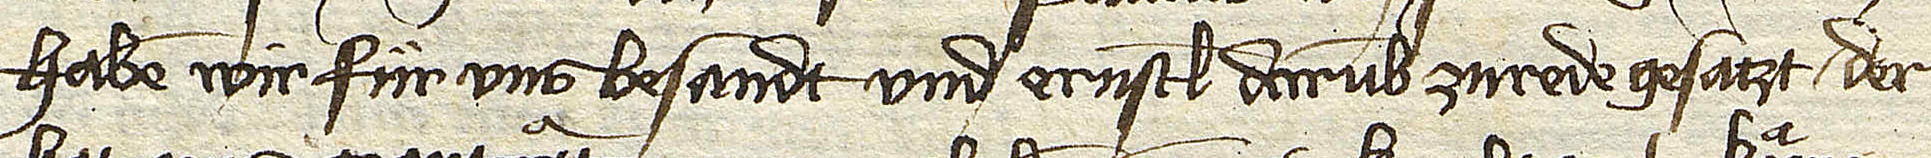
habe* wir für vns beſandt vnd ernſtl* darub* ʒurede geſacʒt / der
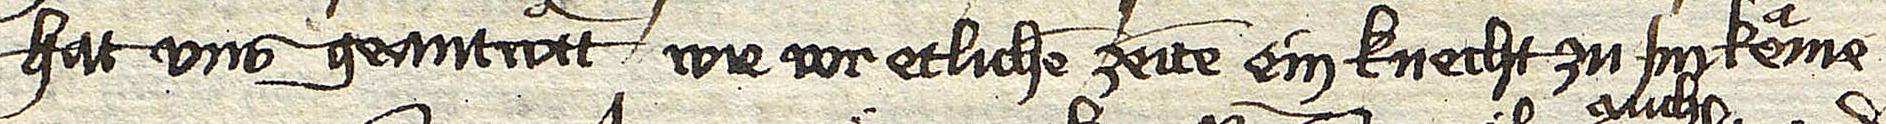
hat vns geantw*tt wie vor etliche* ʒeite* ein knecht ʒu Im këme
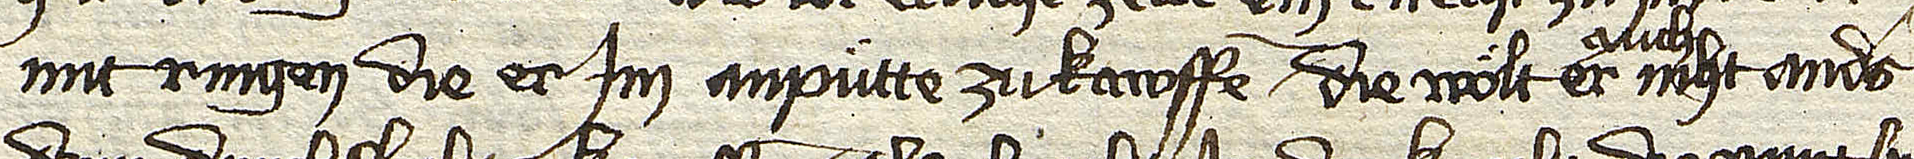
mit ringen die er Im anpütte ʒu kawffe / die wölt er niht and*s
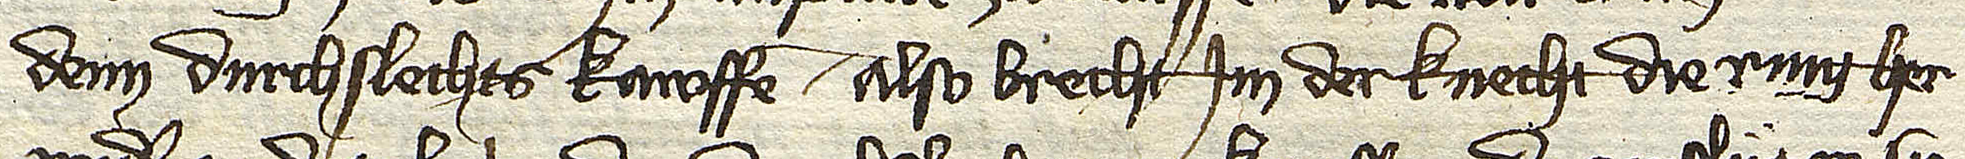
denn durchſlechts kawffe* / Alſo brecht Im der knecht die ring her
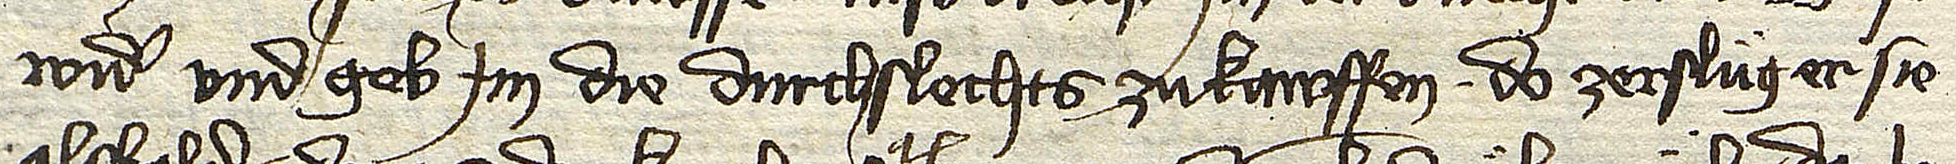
wid* vnd geb Im die durchſlechts ʒu kawffen . do ʒerflüg er ſie
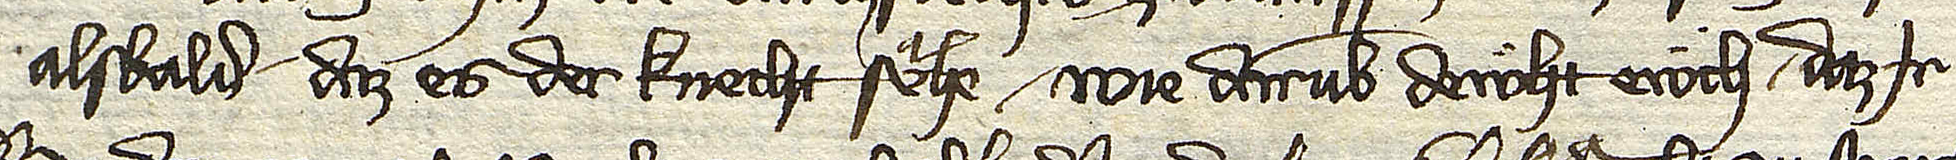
alſbald / daʒ es der knecht ſëhe / wie darub* dewht ewch / daʒ Ir
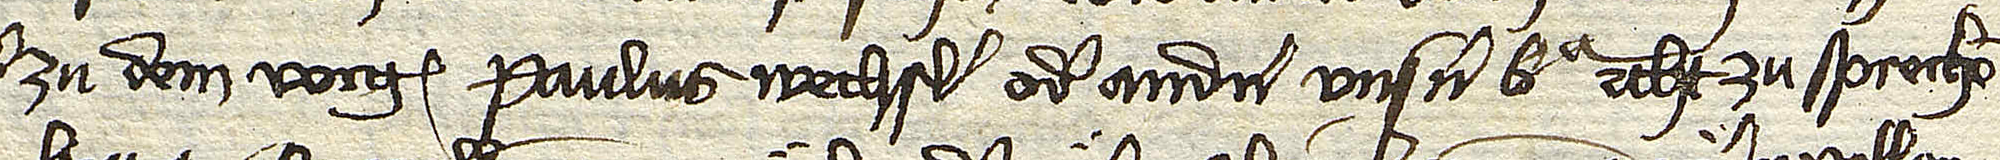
ʒu dem vorg* Paulus wechſl* od* and*n vnſ*n b* icht ʒu ſpreche*
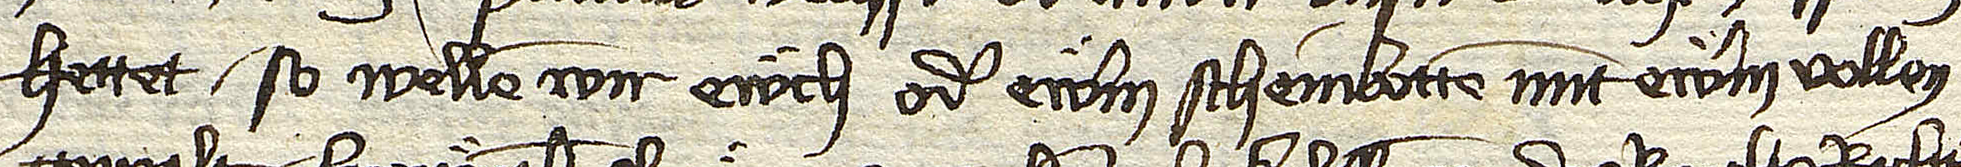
hettet / ſo welle* wir ewch od* ew*m ſcheinbotte* mit ew*m vollen
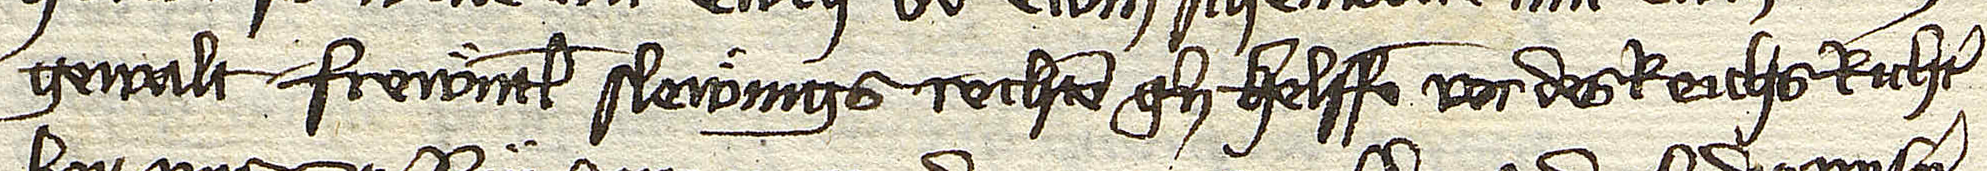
gewalt / frewntl* ſlewnigs rechte* g*n helffe* vor des Reichs Richt*
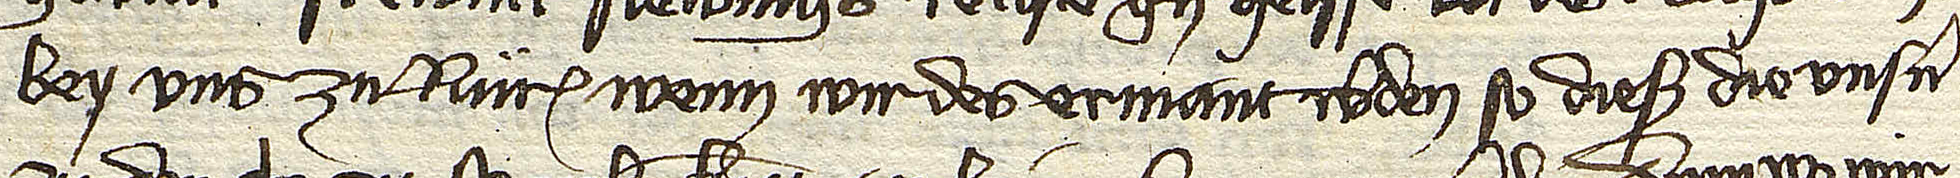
bey vns ʒu Nür* wenn wir des ermant w*den ſo dieſ* die vnſ*n
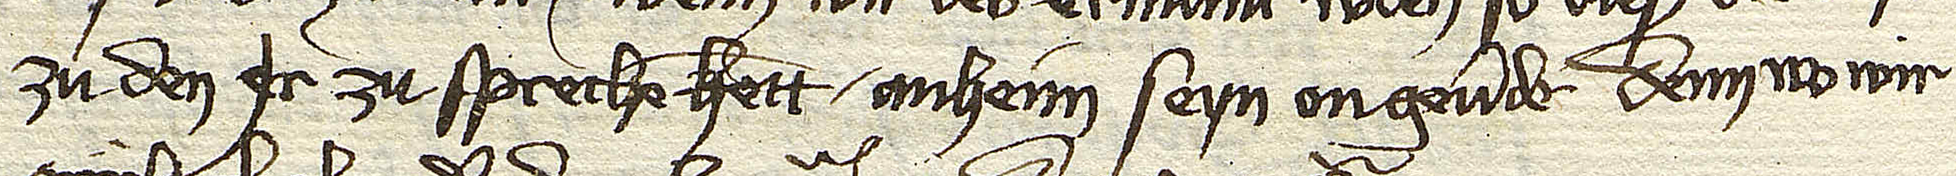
ʒu den er ʒu ſpreche* hett / anheim ſeyn ongeu*de Denn wo wir
